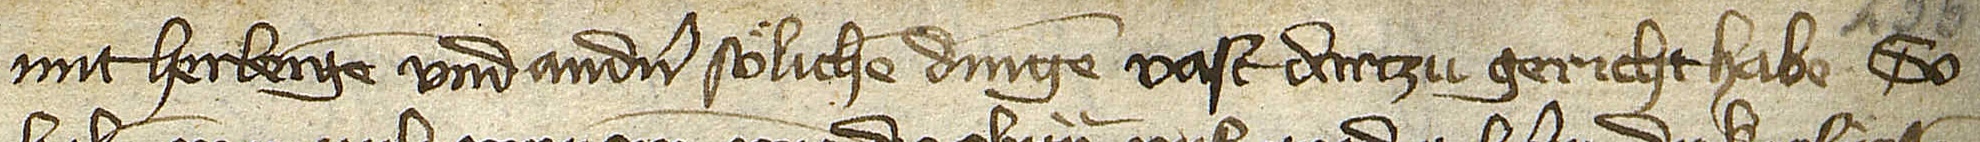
mit herberge* vnd and*n ſöliche* dinge* vaſt darcʒu gericht habe . So
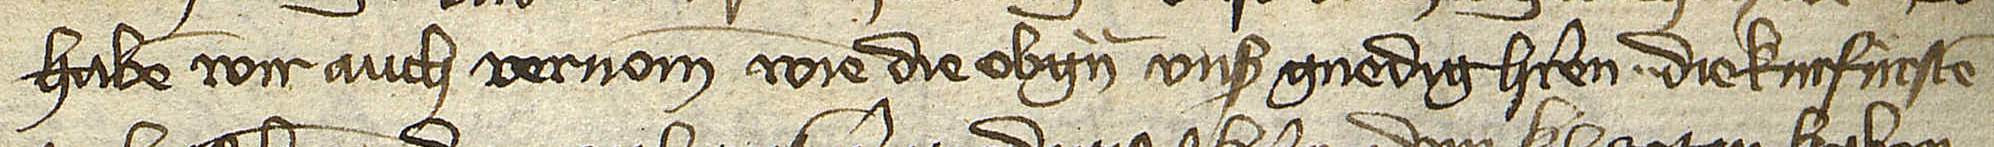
habe* wir auch vernom* wie die obg*n vnſ* gnedig* h*ren ~ die kurfürſte*
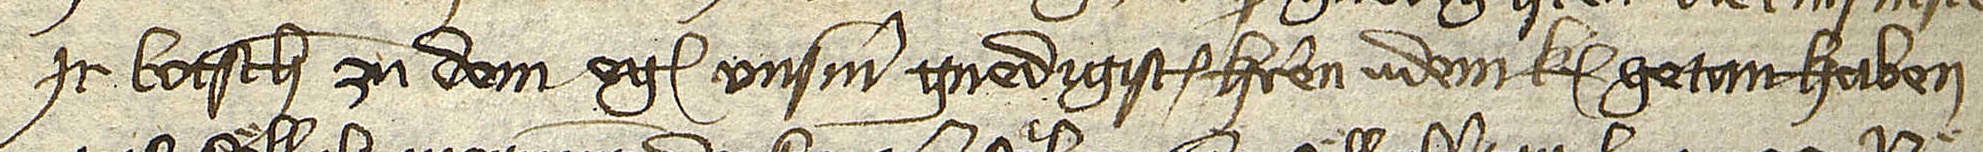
Ir botſch* ʒu dem eg* vnſ*m gnedigiſt* h*ren ~ dem k* getan haben
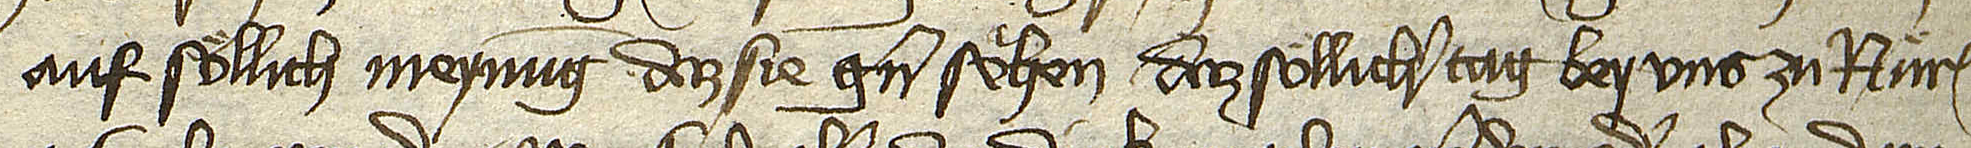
auf ſöllich meynu*g daʒ ſie g*n ſëhen daʒ ſöllich* tag bey vns ʒu Nür*
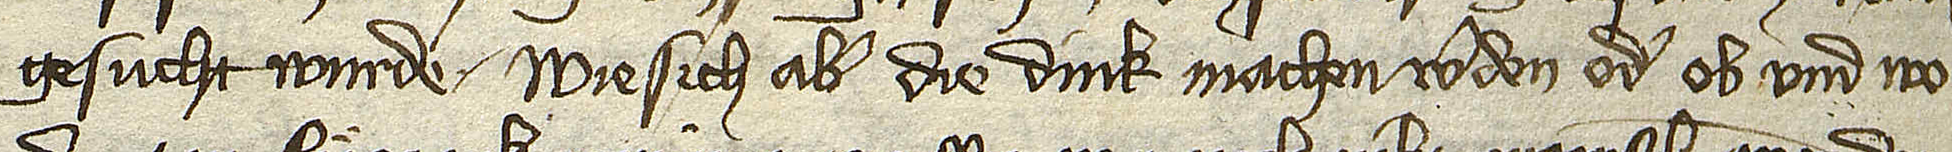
geſucht wurde . / Wie ſich ab* die dink machen w*den od* ob vnd wo
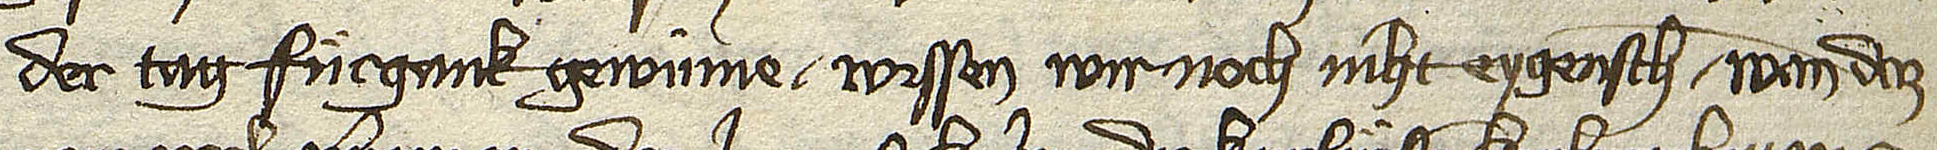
der tag fürgank gewinne / wiſſen wir noch niht eygenſch* / wan daʒ
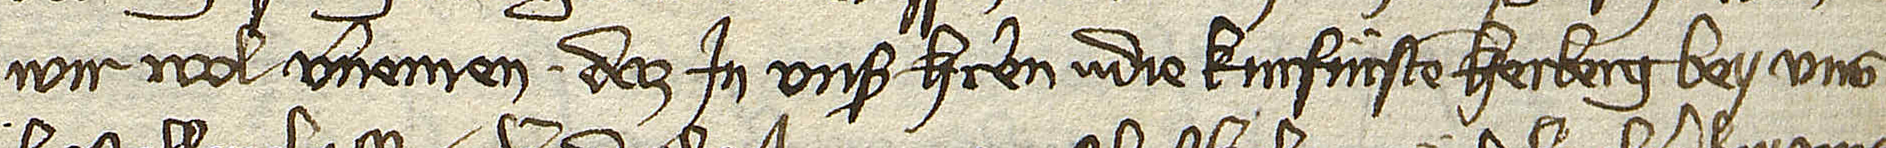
wir wol v*nemen . daʒ In vnſ* h*ren ~ die kurfürſte* herberg bey vns
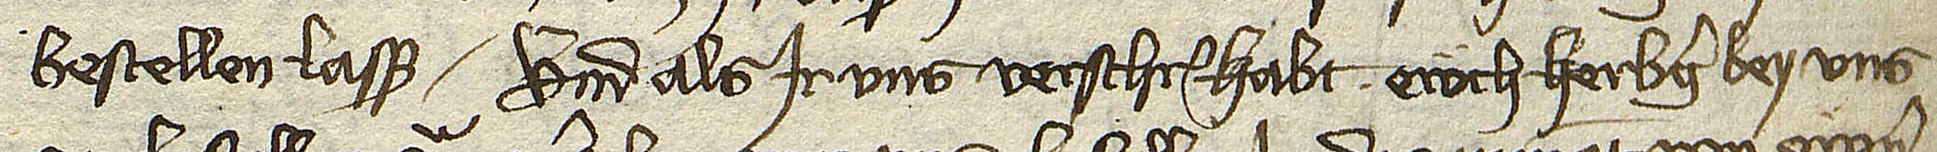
beſtellen laſſ* / Vnd als Ir vns verſchr* habt . ewch herb*g bey vns
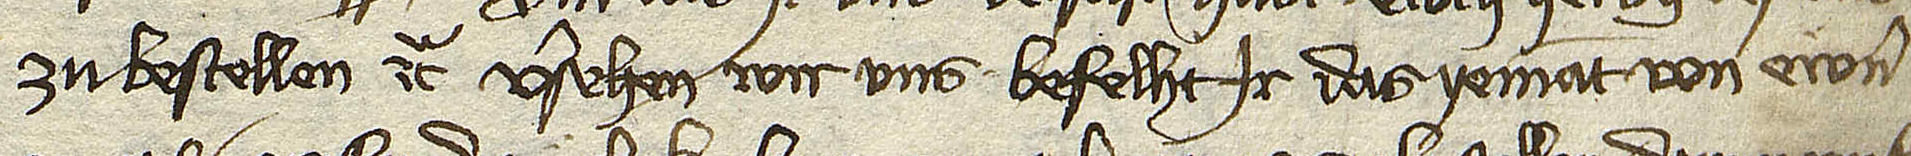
ʒu beſtellen ec* v*ſehen wir vns . befelht Ir das yema*t von ew*n
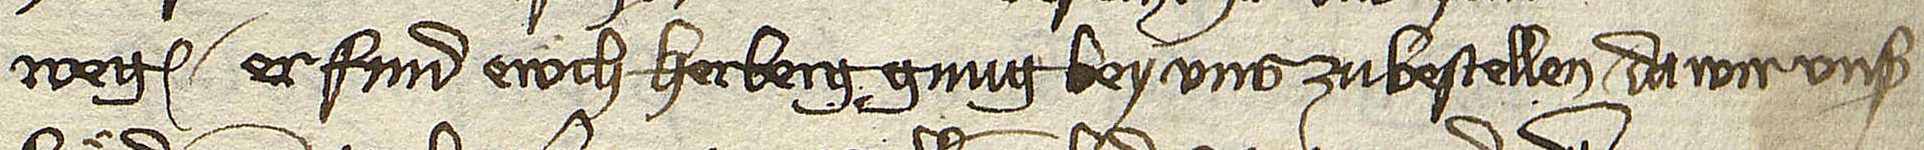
weg* / er find ewch herberg gnug bey vns ʒu beſtellen / da wir vnſ*
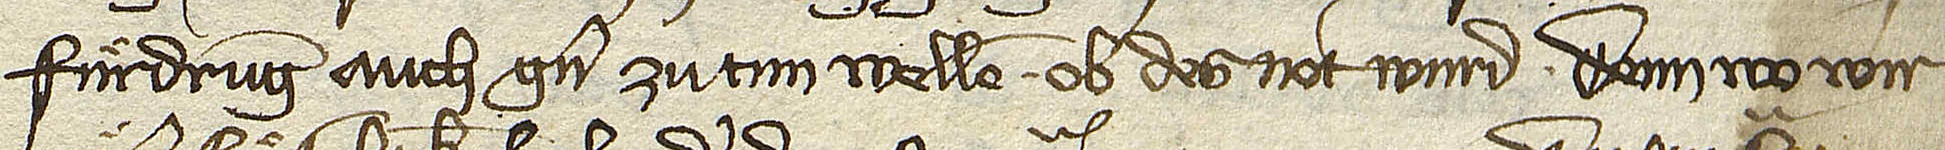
fürdru*g auch g*n ʒu tun welle* ob des not wurd . Denn wo wir
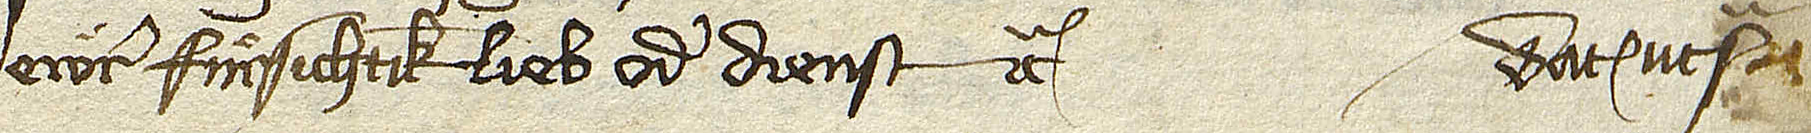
ew*r fürſichtik* lieb od* dienſt ec* / Dat* ut ſ*
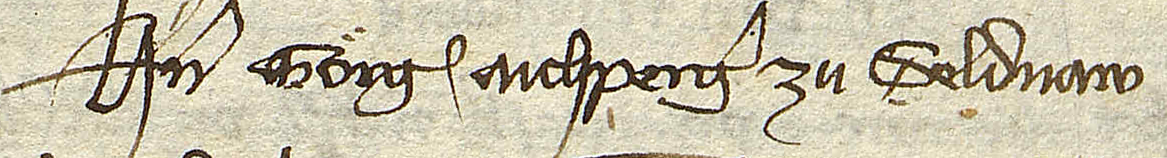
H*n Görg* aichperg* ʒu Seldnaw
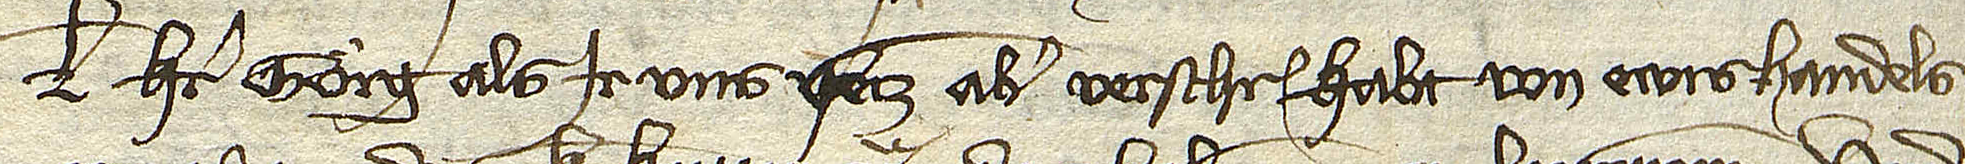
L* h*r Görg als Ir vns yecʒ* ab* verſchr* habt von ewrs handels
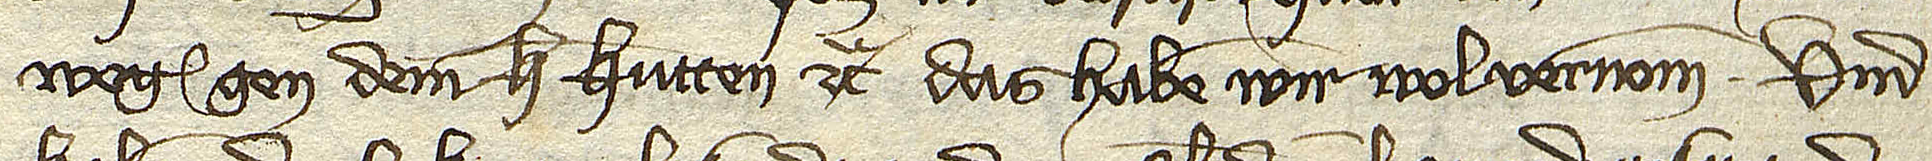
weg* gen den h* hutten ec* das habe* wir wol vernom* . Vnd
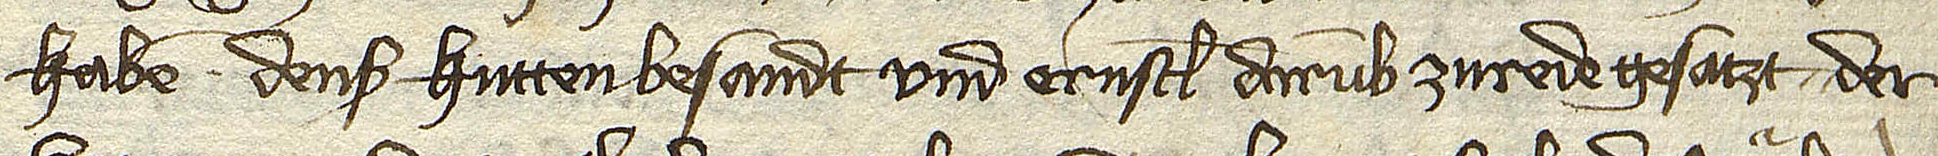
habe* . denſ* hutten beſandt vnd ernſtl* daru*b ʒurede geſacʒt // der
